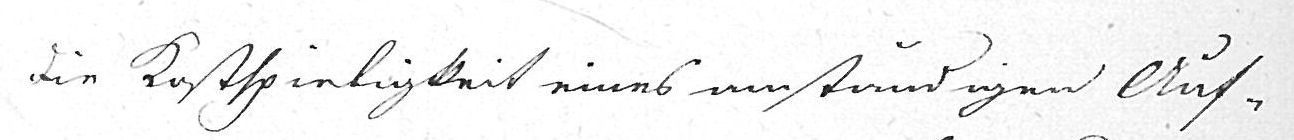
Die Kostspieligkeit eines anständigen Auf-
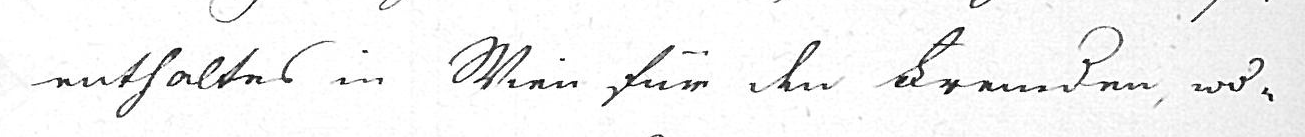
enthaltes in Wien für den Fremden, wo-
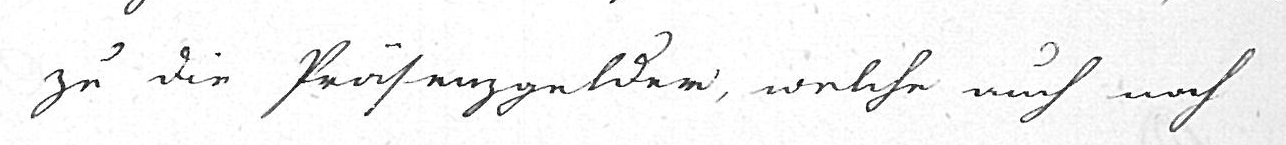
zu die Präsenzgelder, welche auch nach
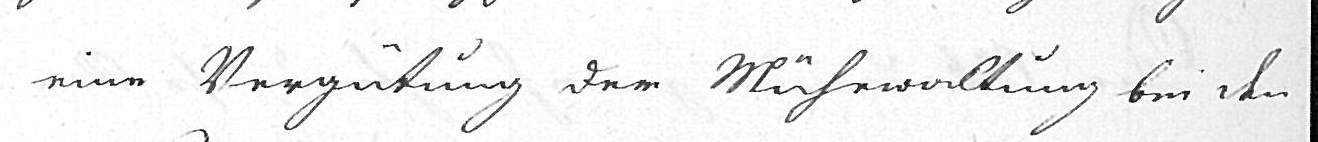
einer Vergütung der Mühewaltung bei den
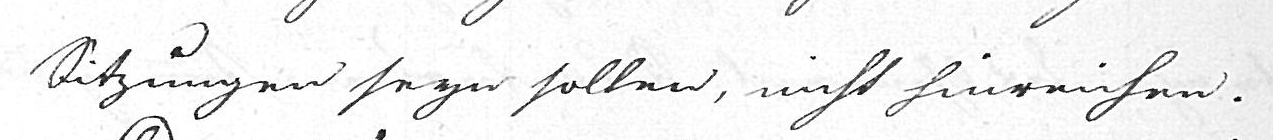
Sitzungen seyn sollen, nicht hinreichen.
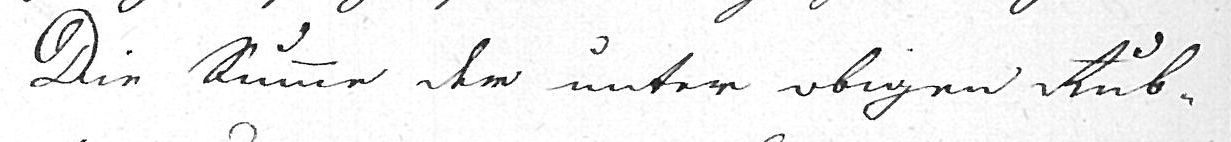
Die Summe der unter obigen Rub-
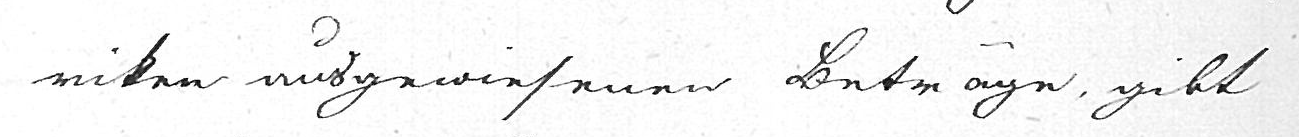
riken ausgewiesenen Betrage, gibt
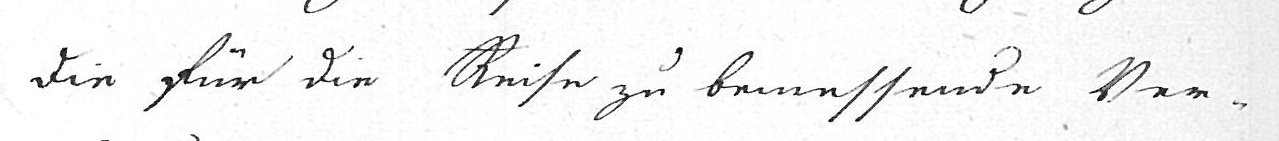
die für die Reise zu bemessende Ver-
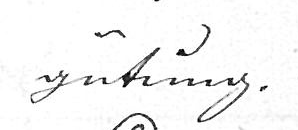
gütung.
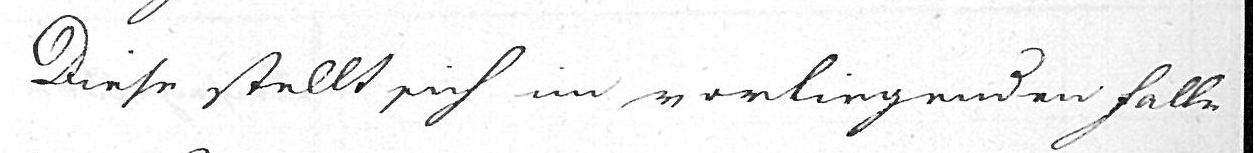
Diese stellt sich im vorliegenden Falle
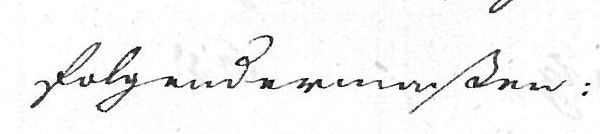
folgendermaßen:
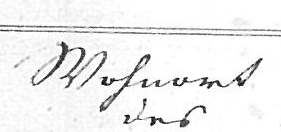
Wohnort
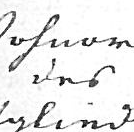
des
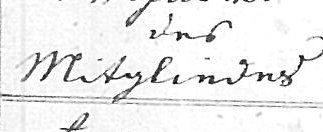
Mitgliedes
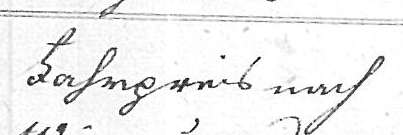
Bahnpreis nach
